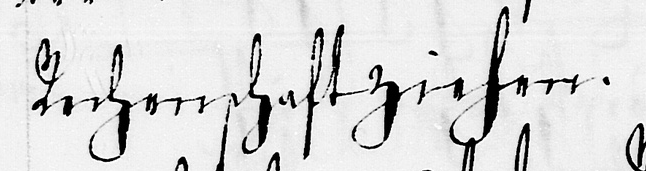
Rechenschaft ziehen.
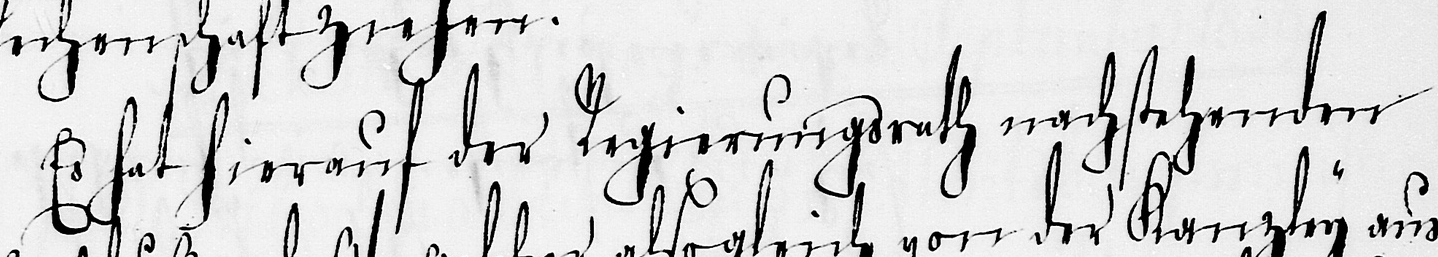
Es hat hierauf der Regierungsrath nachstehenden
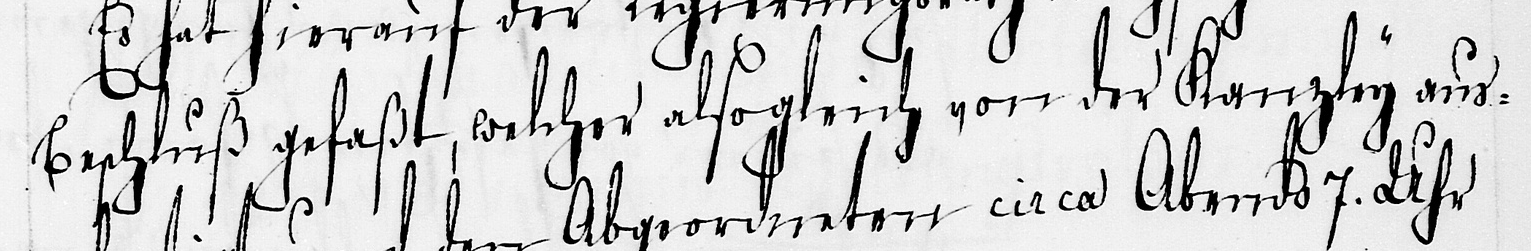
Beschluß gefaßt, welcher alsogleich von der Kanzley aus¬
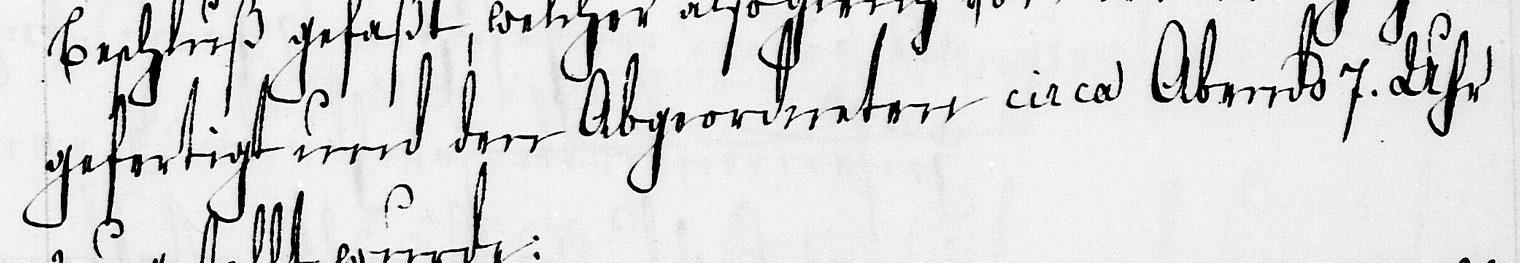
gefertigt und den Abgeordneten circa Abends 7. Uhr
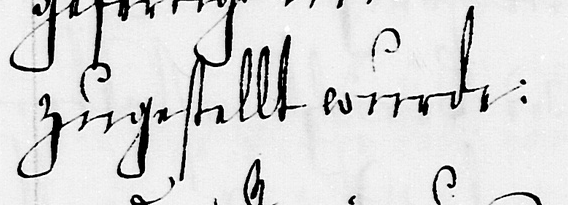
zugestellt wurde:
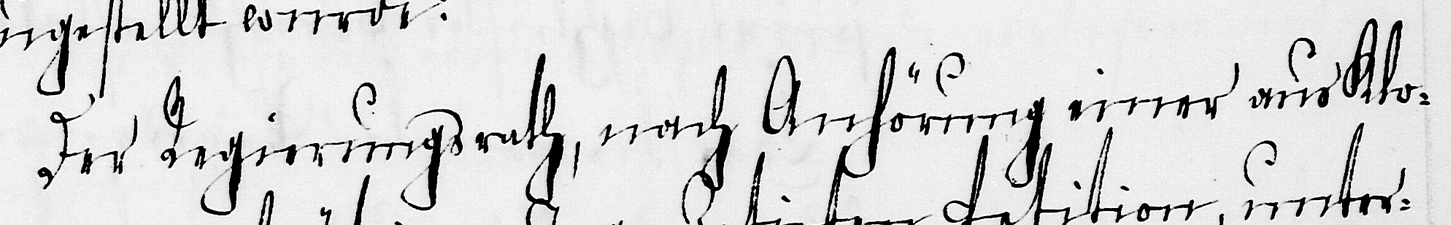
Der Regierungsrath, nach Anhörung einer aus Klo¬
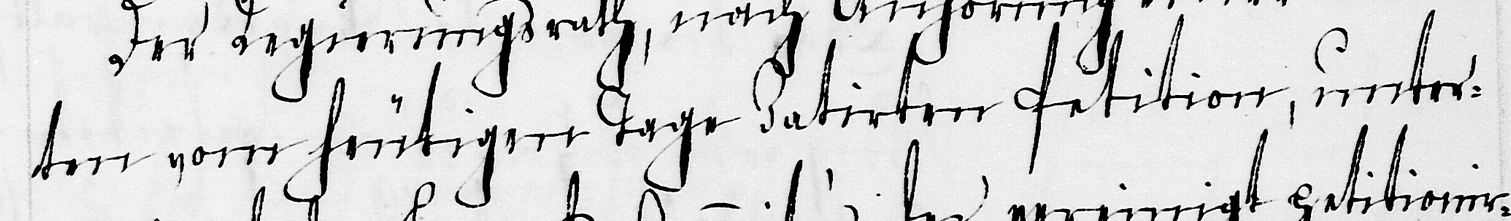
ten vom heutigen Tage datirten Petition, unter¬
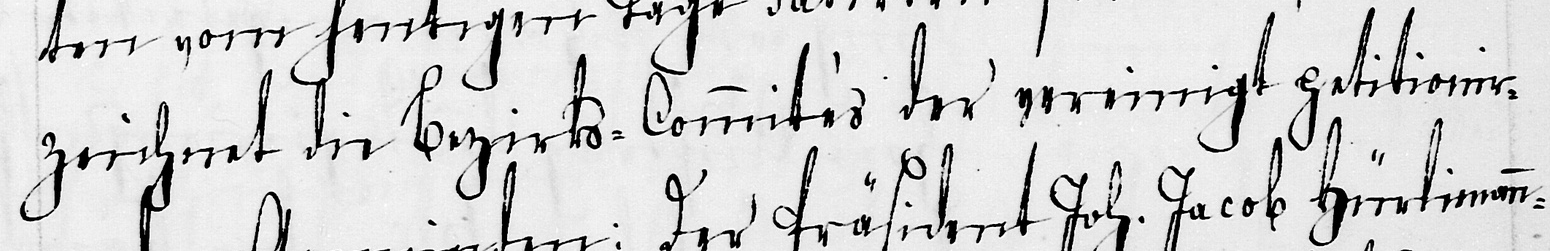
zeichnet die Bezirks-Commités der vereinigt petitionir¬
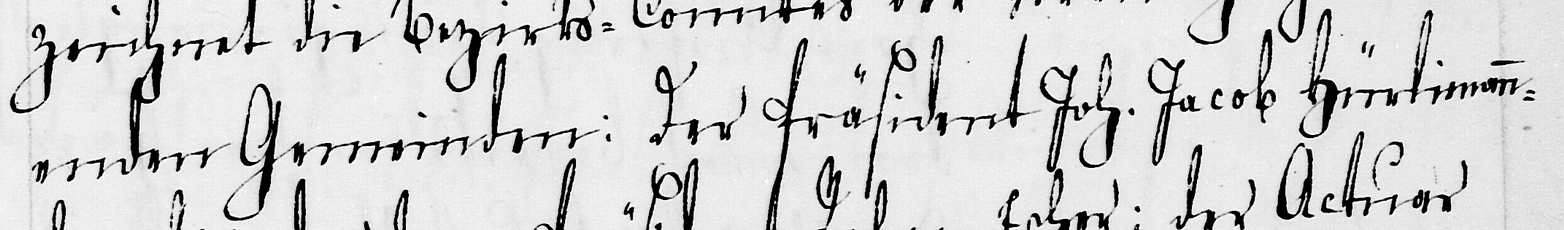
enden Gemeinden: Der Präsident Joh. Jacob Hürliman¬
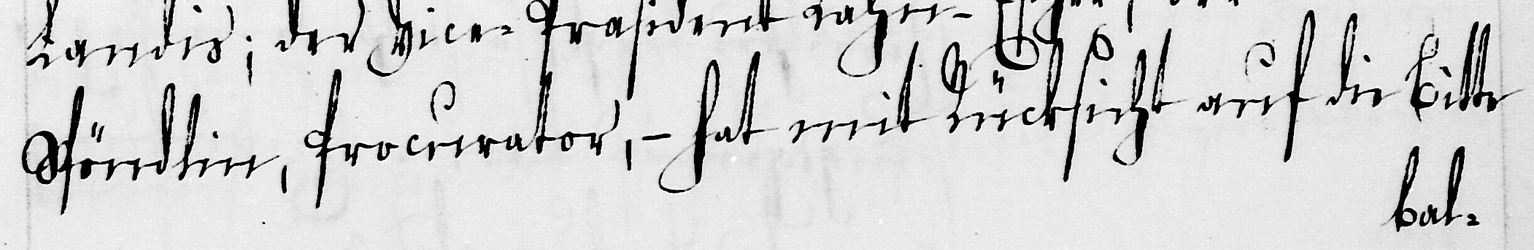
Spöndlin, Procurator, − hat mit Rücksicht auf die Bitte
